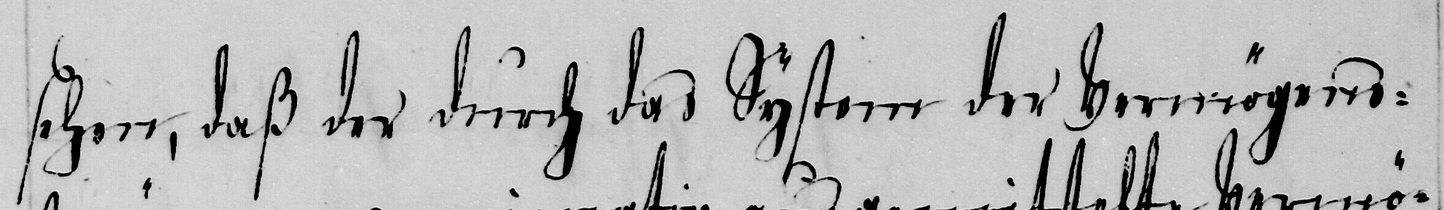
sehen, daß der durch das System der Vermögens¬
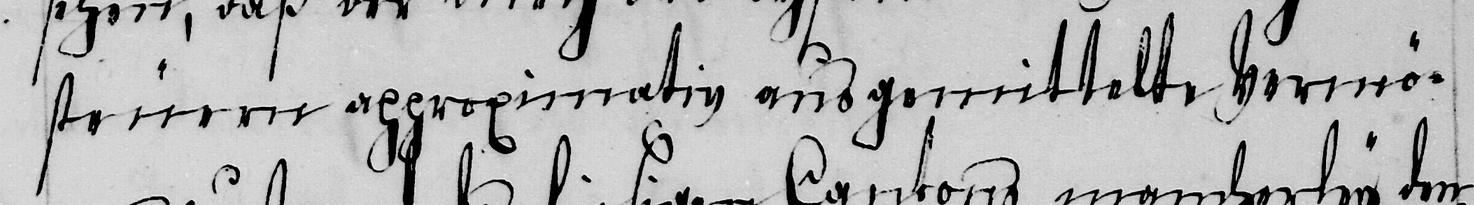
steuern approximativ ausgemittelte Vermö¬
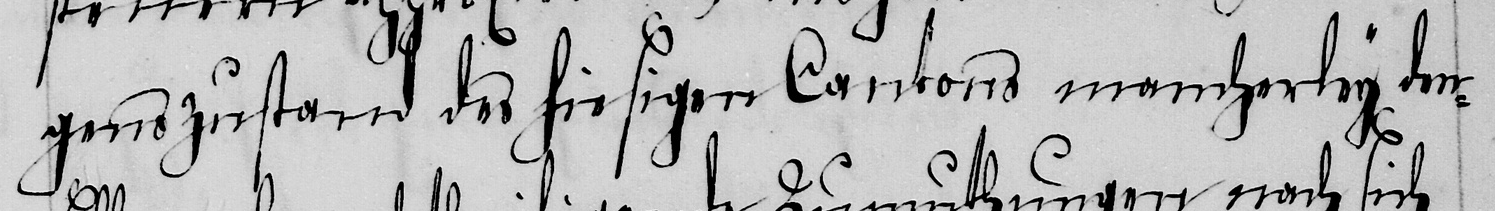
genszustand des hiesigen Cantons mancherley den¬
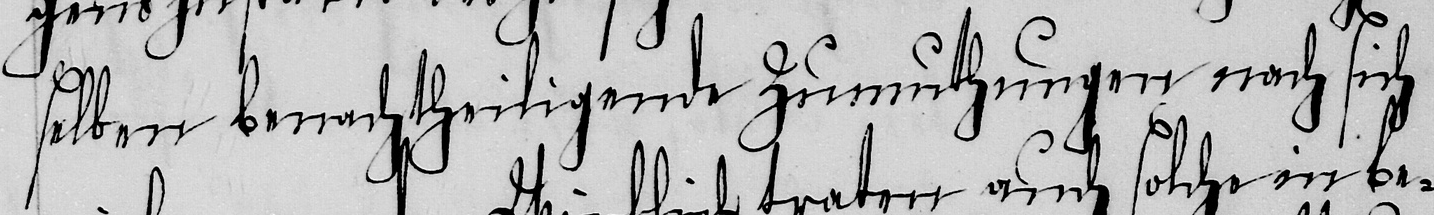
selben benachtheiligende Zumuthungen nach sich
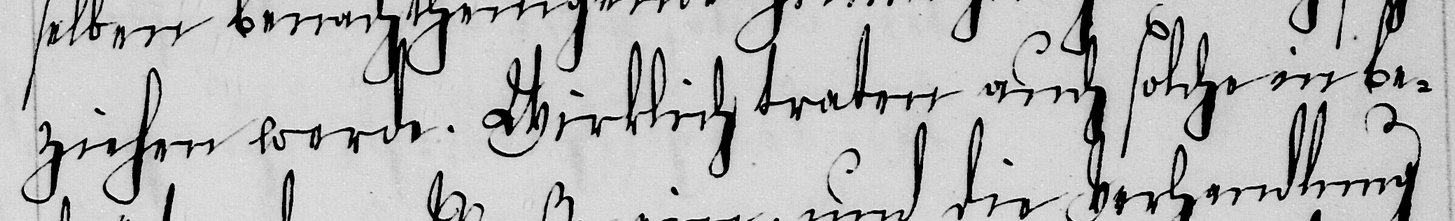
ziehen werde. Wirklich traten auch solche in be¬
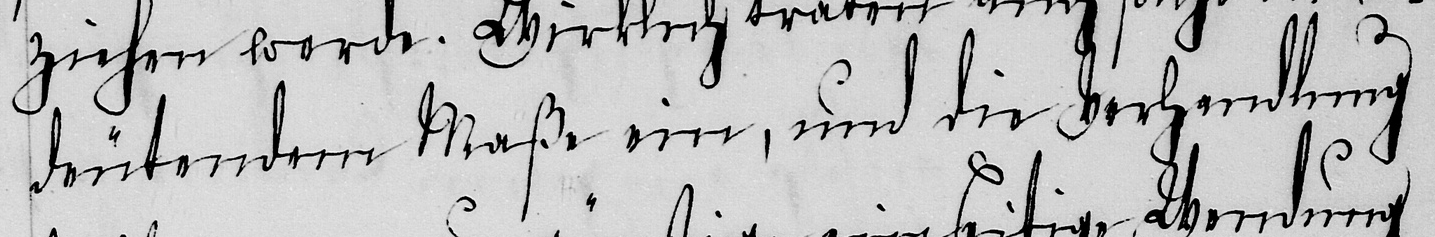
deutendem Maße ein, und die Verhandlung
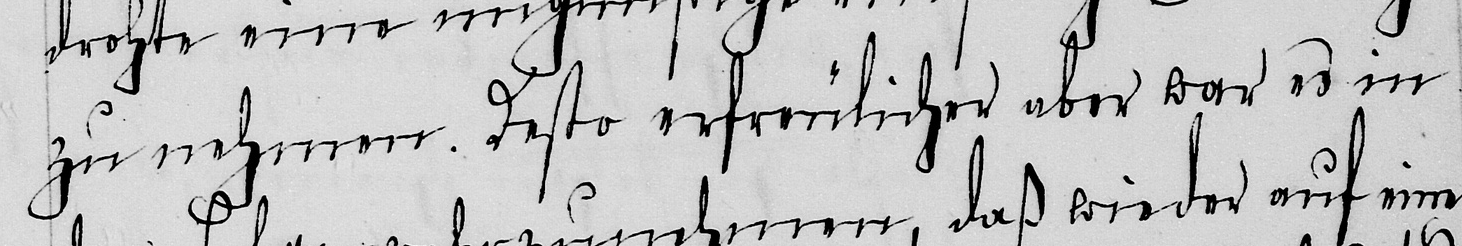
zu nehmen. Desto erfreulicher aber war es in
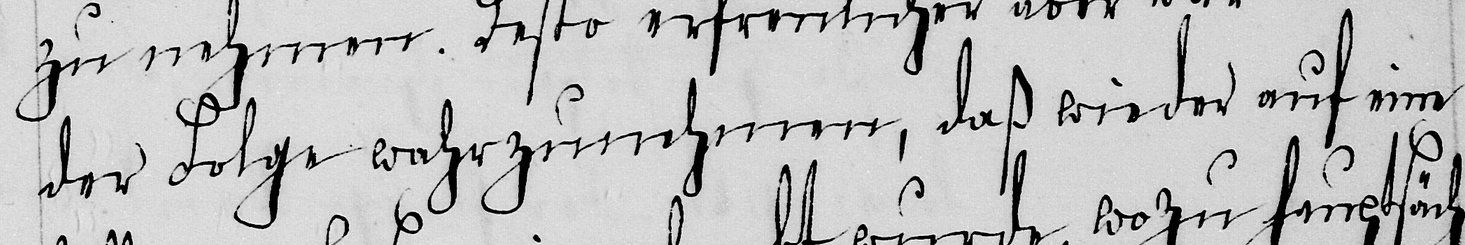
der Folge wahrzunehmen, daß wieder auf eine
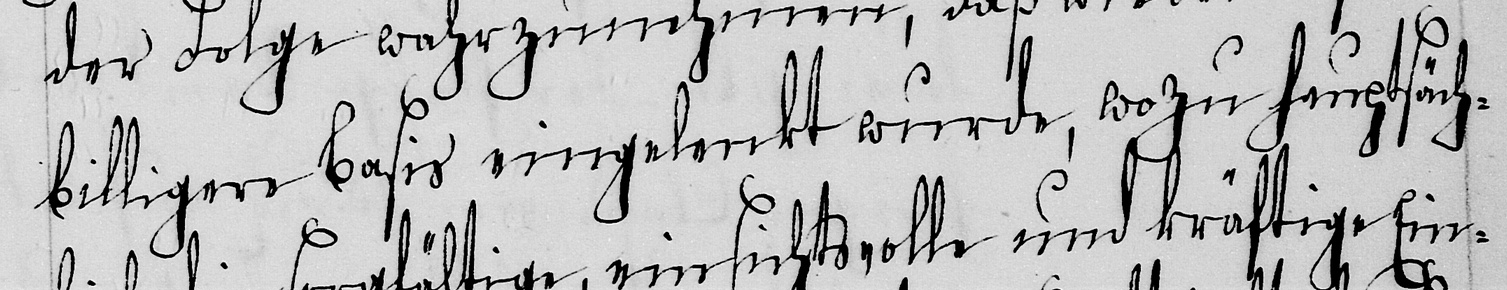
billigere Basis eingelenkt wurde, wozu hauptsäch¬
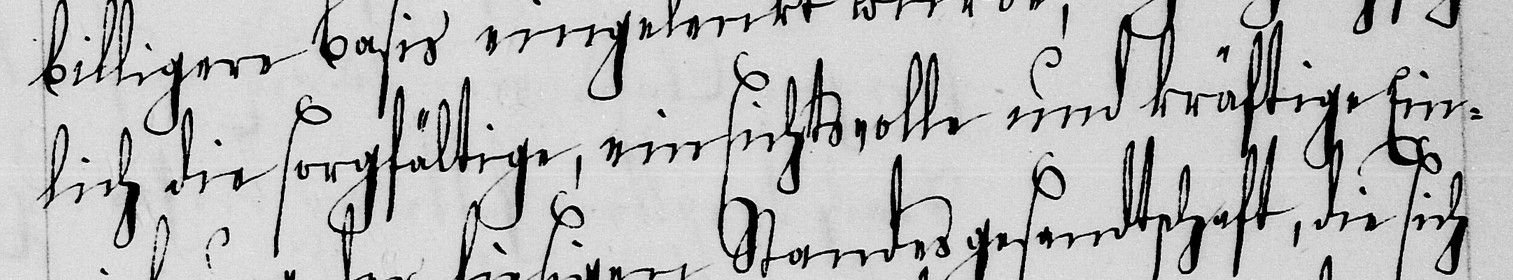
lich die sorgfältige, einsichtsvolle und kräftige Ein¬
